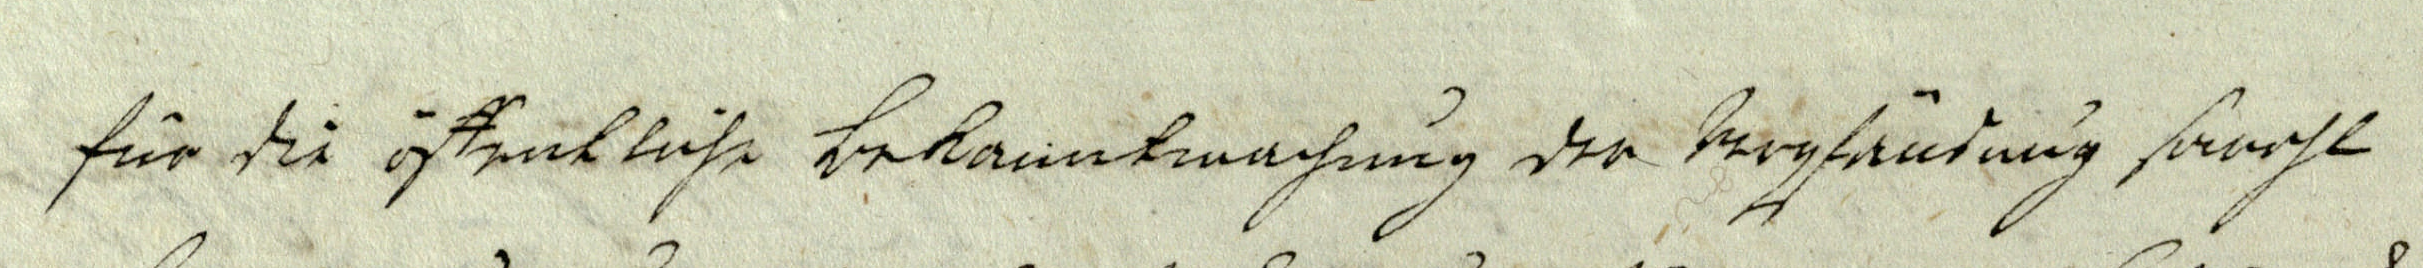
für die öffentliche Bekanntmachung der Verpfändung sowohl
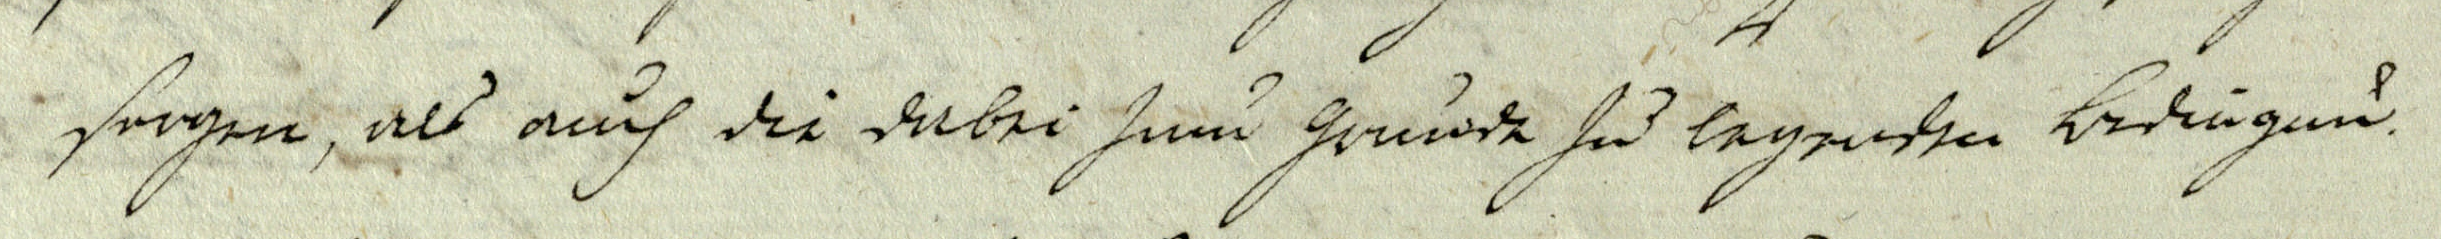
sorgen, als auch die dabei zum Grunde zu legenden Bedingun¬
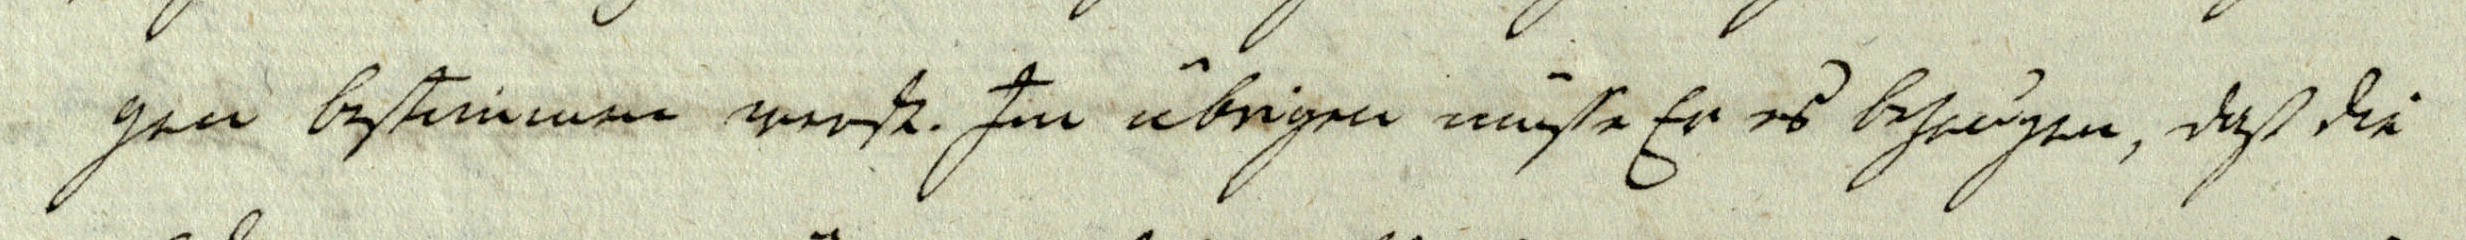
gen bestimmen werde. In übrigen müsse Er es bezeugen, daß die
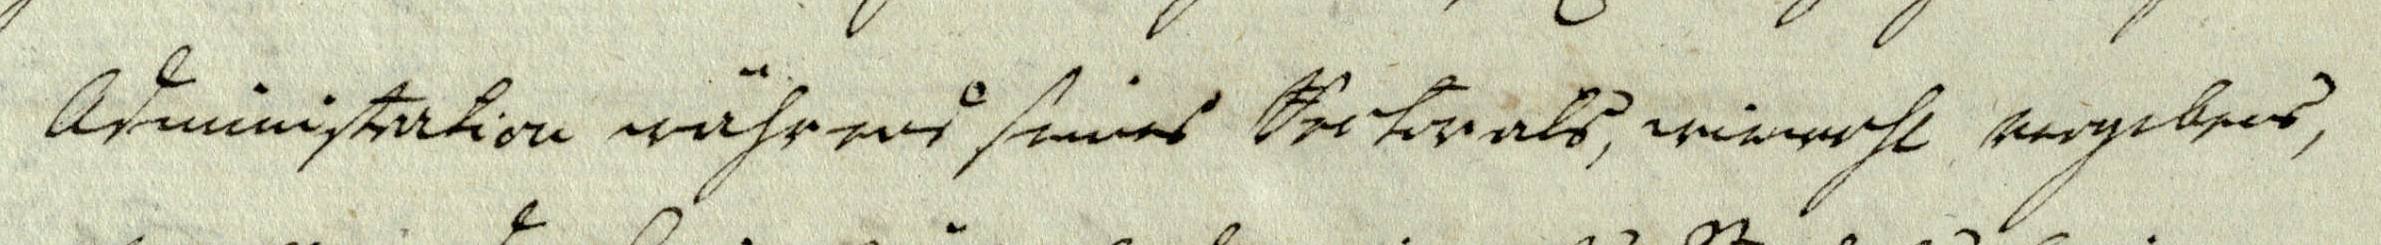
Administration während seines Rectorats, wiewohl vergebens,
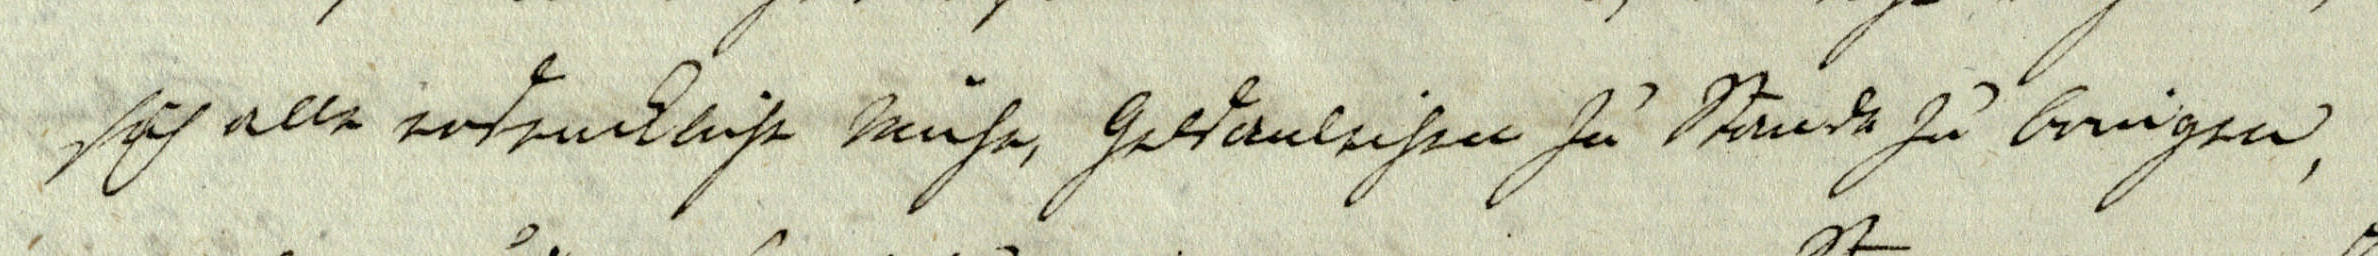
sich alle erdenkliche Mühe, Geldanleihen zu Stande zu bringen,
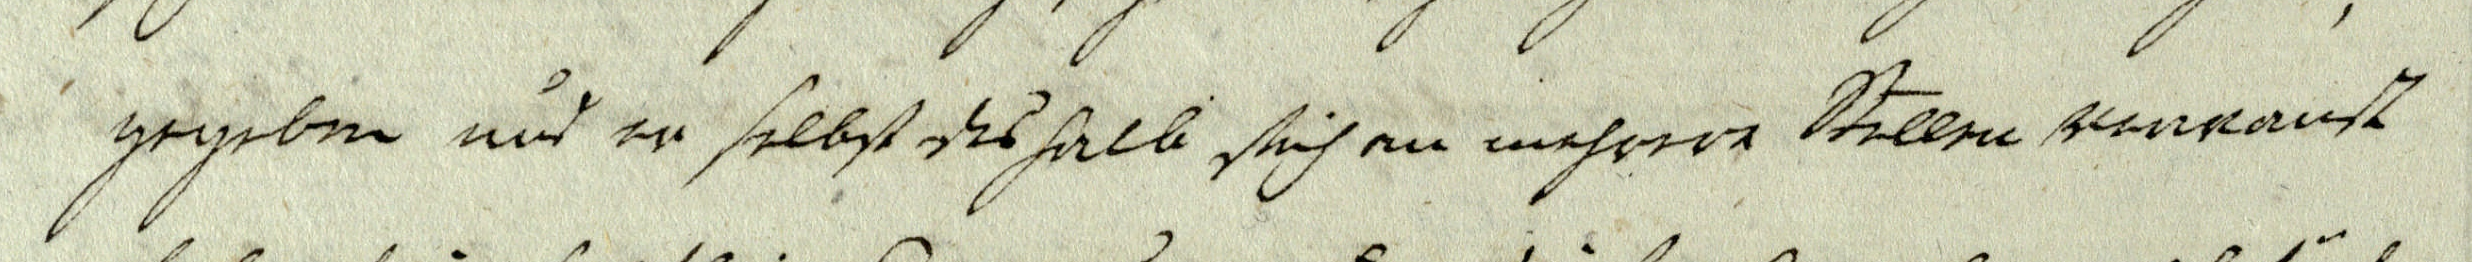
gegeben und er selbst deshalb sich an mehrere Stellen verwandt
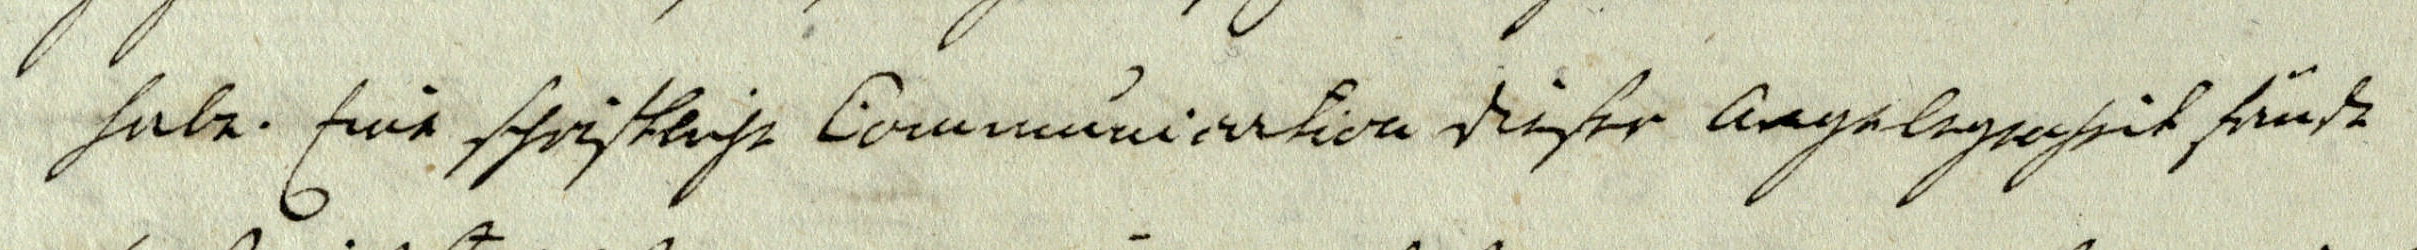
habe. Eine schriftliche Communication dieser Angelegenheit fände
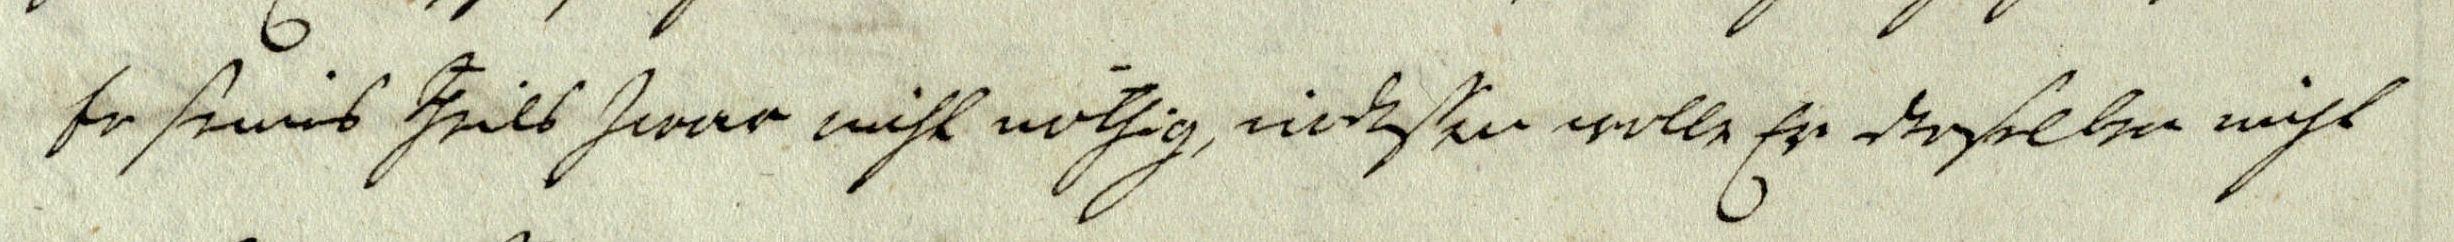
Er seines Theils zwar nicht nöthig, indessen wolle Er derselben nicht
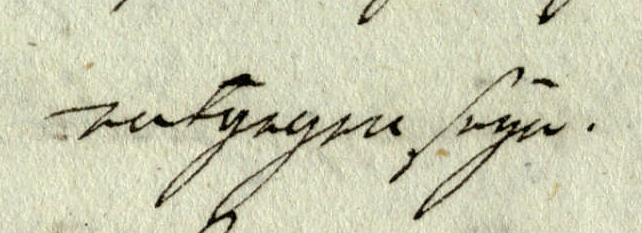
entgegen seÿn.
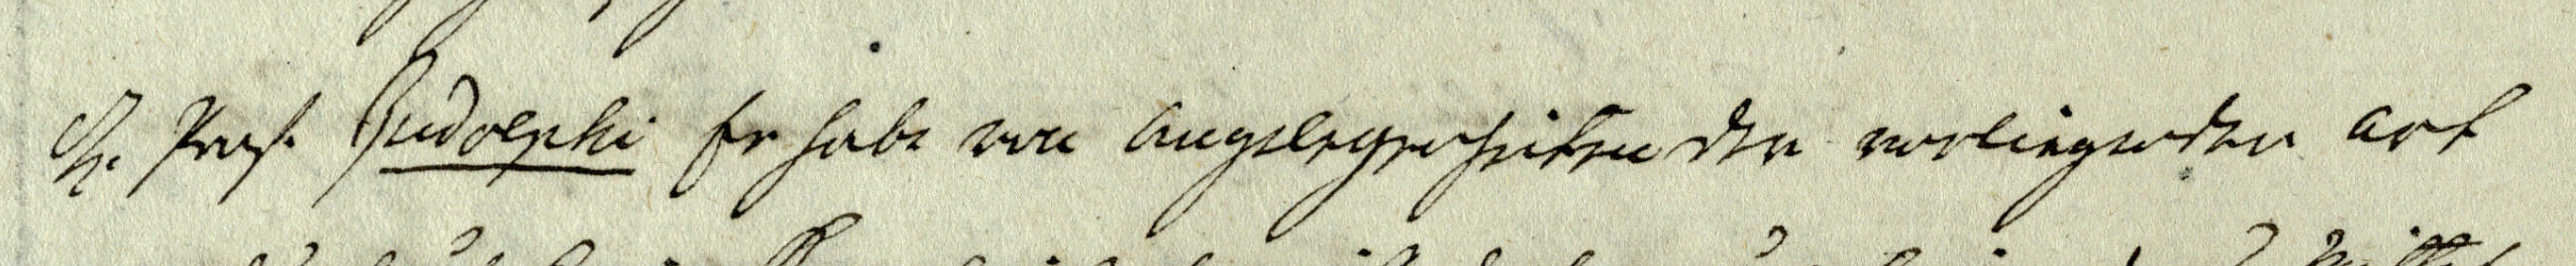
dh. Prof. Rudolphi Er habe von Angelegenheiten der vorliegenden Art
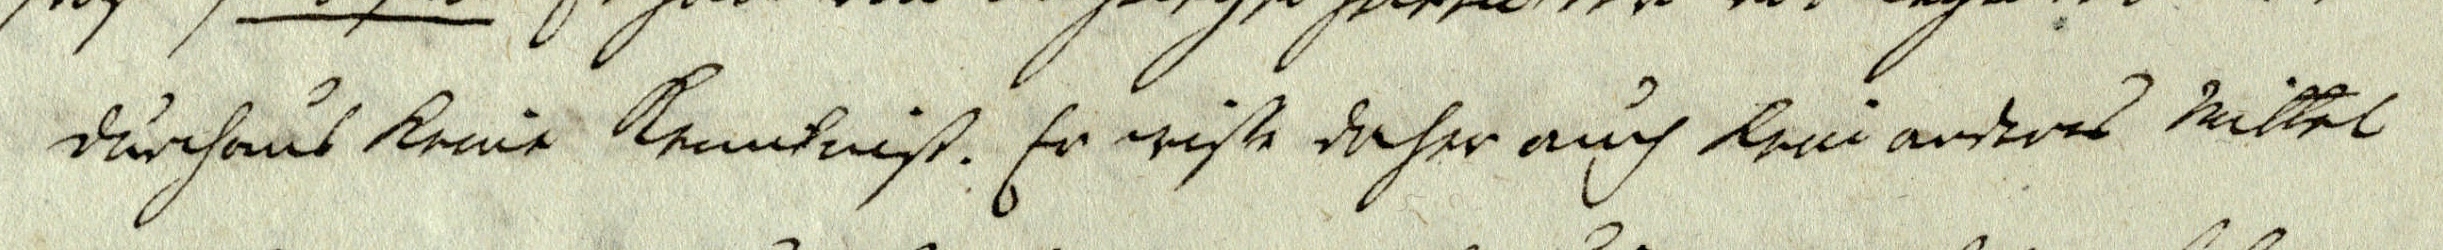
durchaus keine Kenntniß. Er wisse daher auch kein anderes Mittel
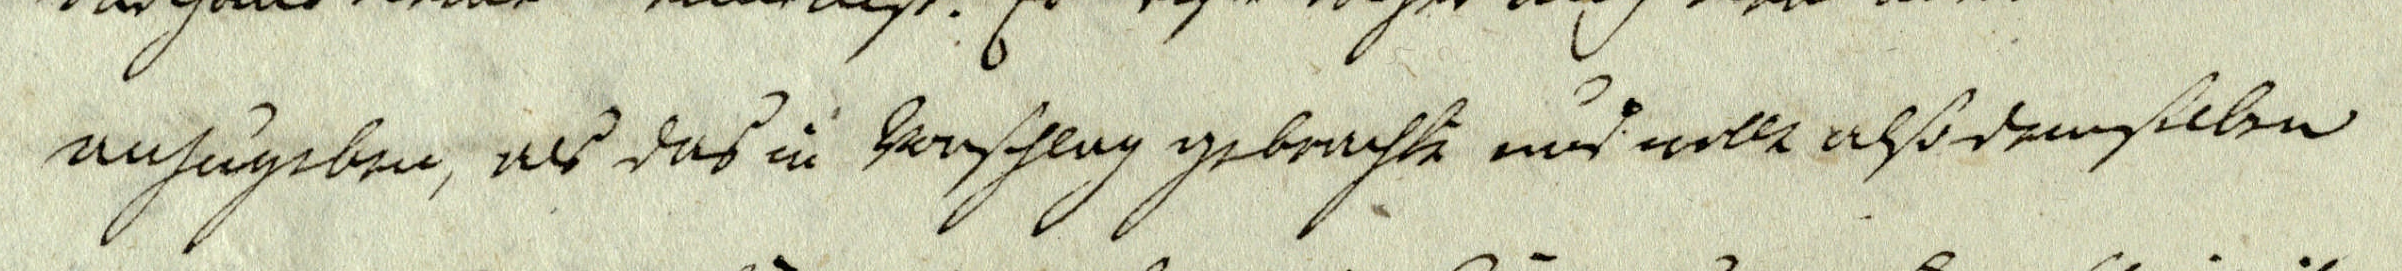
anzugeben, als das in Vorschlag gebrachte und wolle also demselben
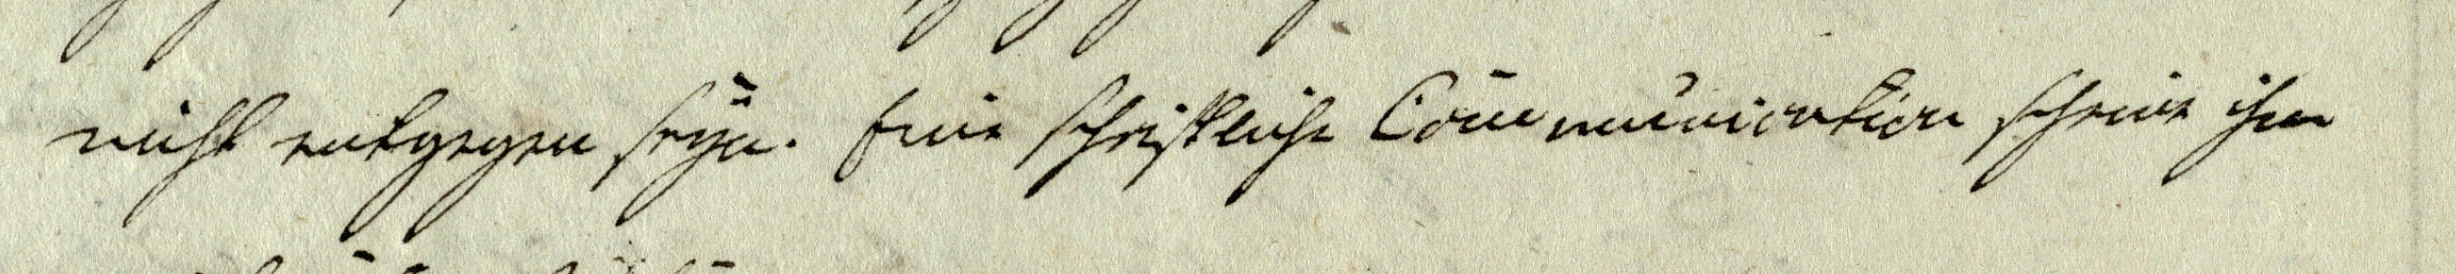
nicht entgegen seÿn. Eine schriftliche Communication scheine ihm
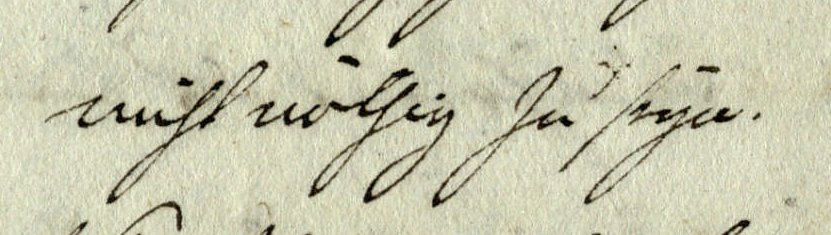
nicht nöthig zu seÿn.
